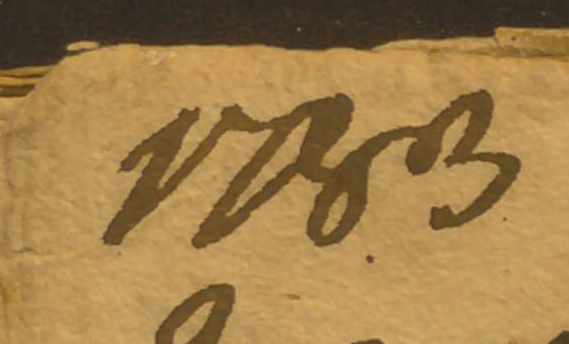1783
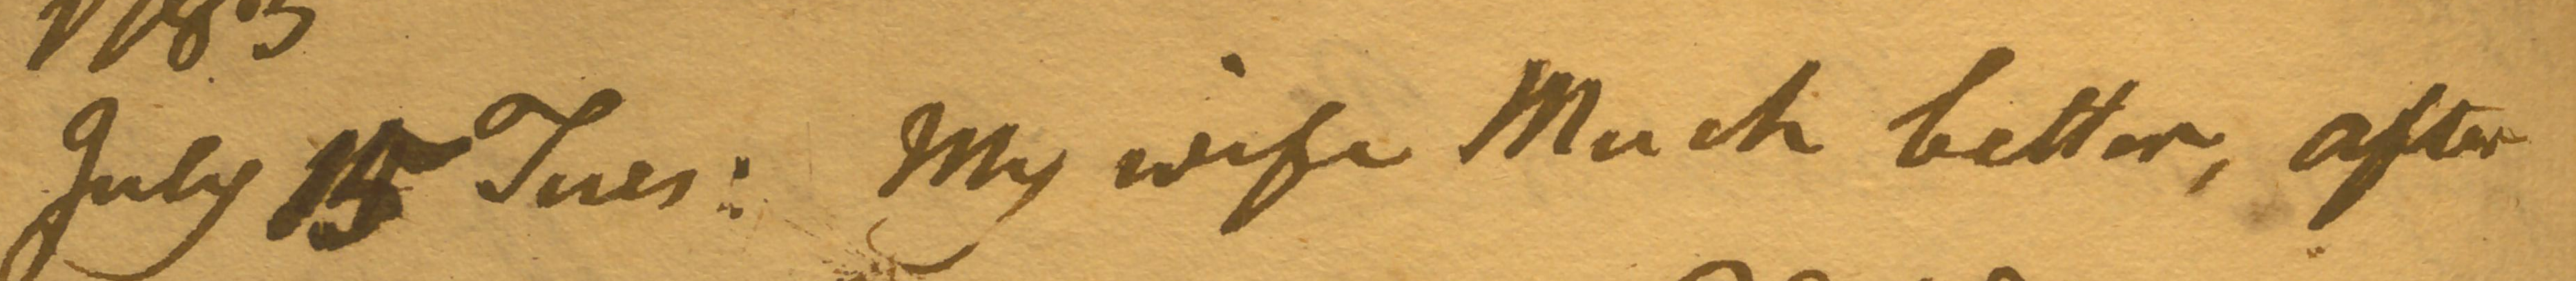July 15 Tues: My wife Much better, after
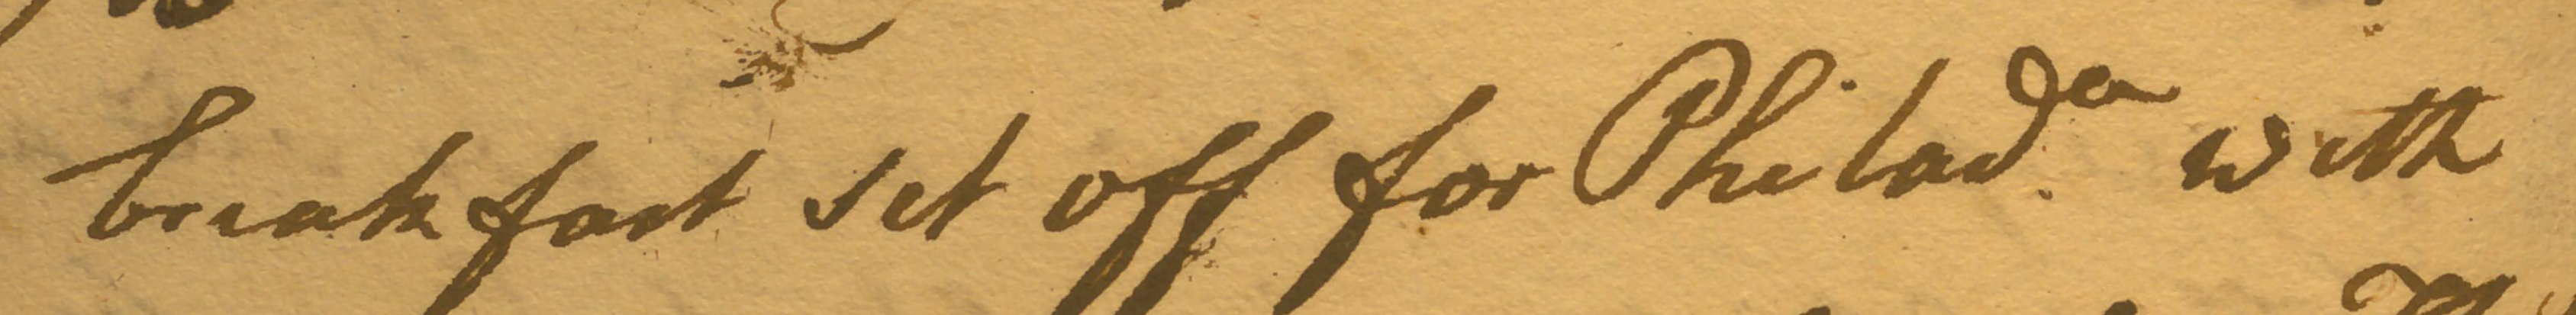breakfast set off for Philad^a. with
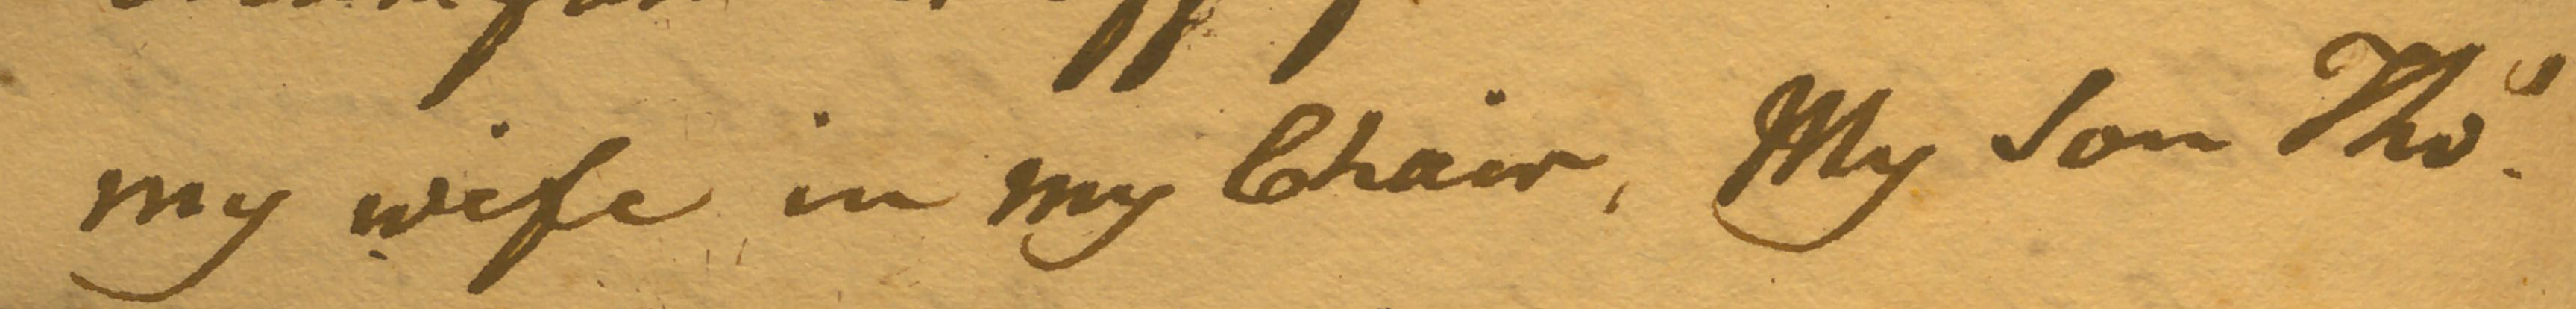my wife in my Chair, My son Tho^s.
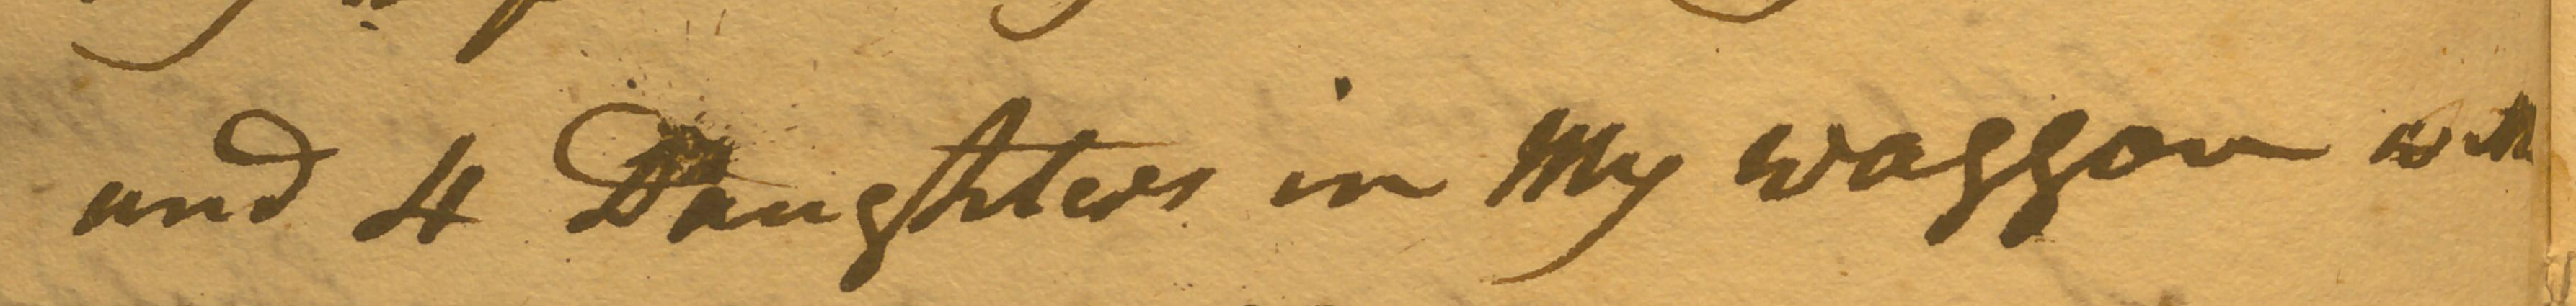and 4 Daughters in My waggon with
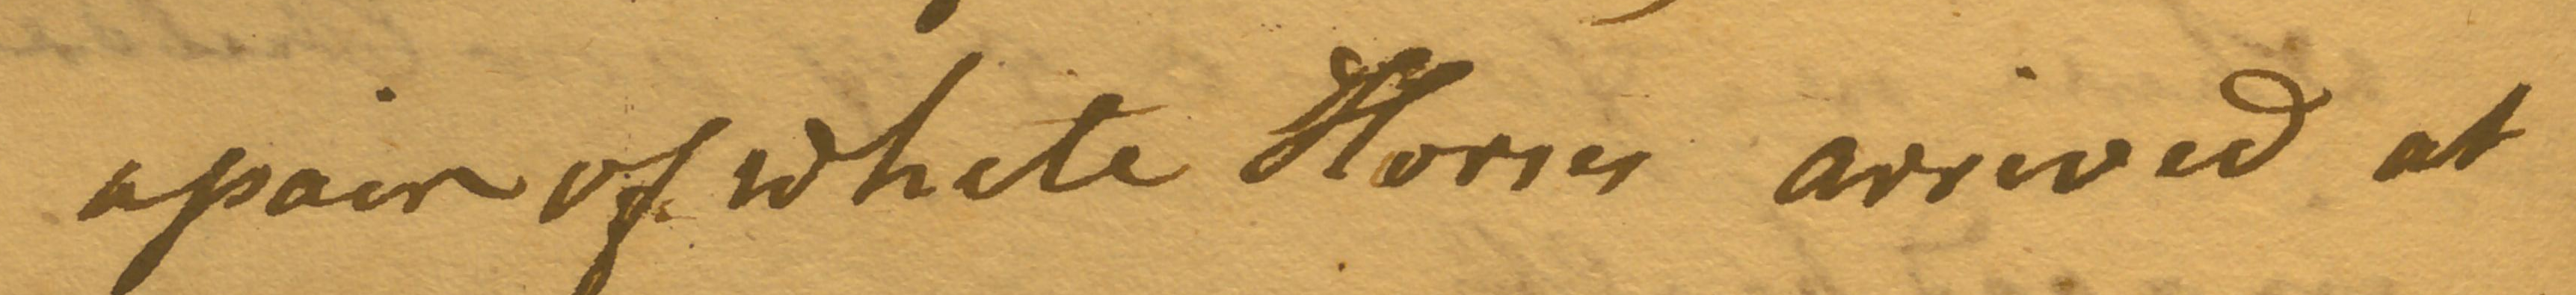a pair of White Horses arrived at
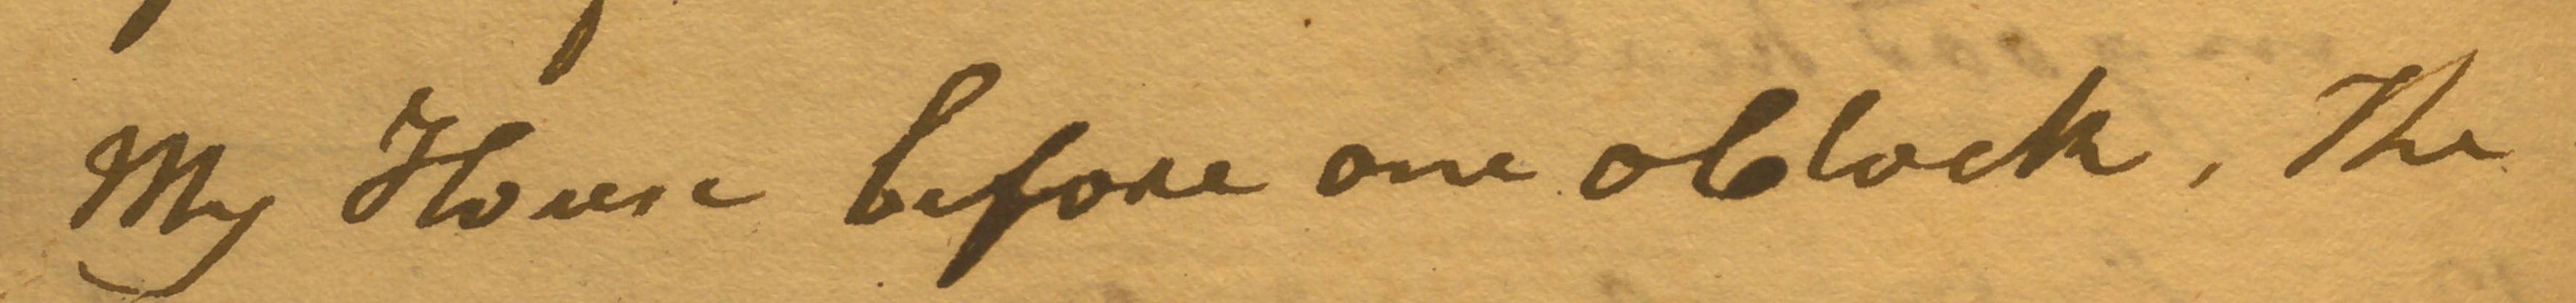My House before one oClock, The
